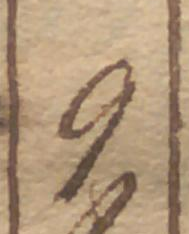9
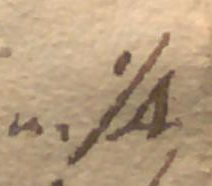1/4
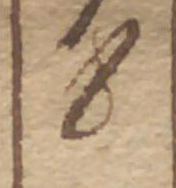8
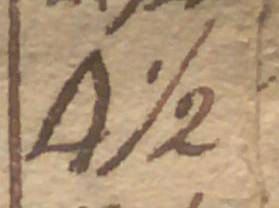4 1/2
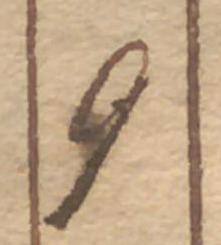9
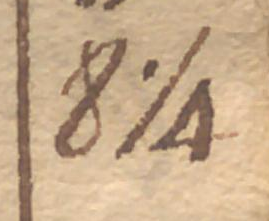8 1/4
